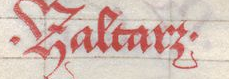.Zaltarz.
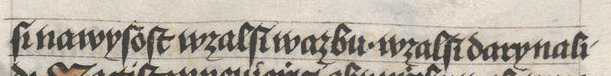ſi nawyſoſt wzalſi wazbu.wzalſti dary nali¬
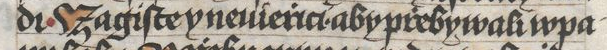dy.Zagiſte y neuieṙici.aby pṙebywali wpa¬
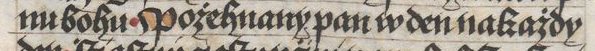nu bohu.Požehnany pan w den nakaždy
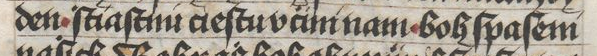den.ẛtiaſtnú cieſtu vċini nam.bóh ſpaſení
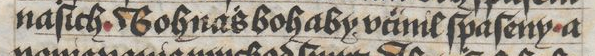naẛich.Bohnaṡ boh aby vċinil ſpaſeny.a
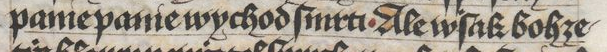panie panie wychod ſmrti.Ale wẛak bohze
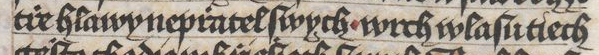tṙe hlawy nepṙatel ſwych.wrch wlaſu tiech
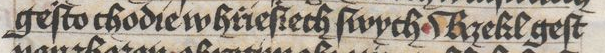geẛto chodíe whṙieẛieth ſwych.Rzekl geſt
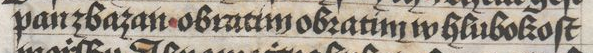par zbazan.obratim obratim w hlubokoſt
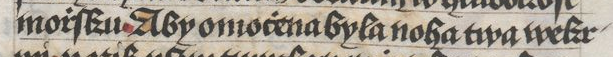moṙſku.Aby omoċena byla noha twa wekr¬
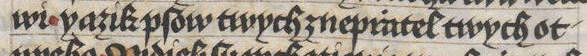wi.yazik pſow twych znepṙatel twych ot¬
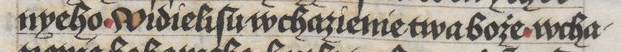nyeho.Vidieliſu wchazienie twa boże.wcha
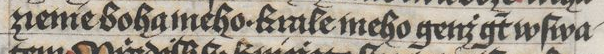zienie boha meho.krale meho genž ḡt wſwa¬
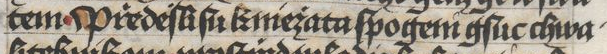tem.Pṙedeẛli ſu kniežata ſpogeni gſuc chwa¬
